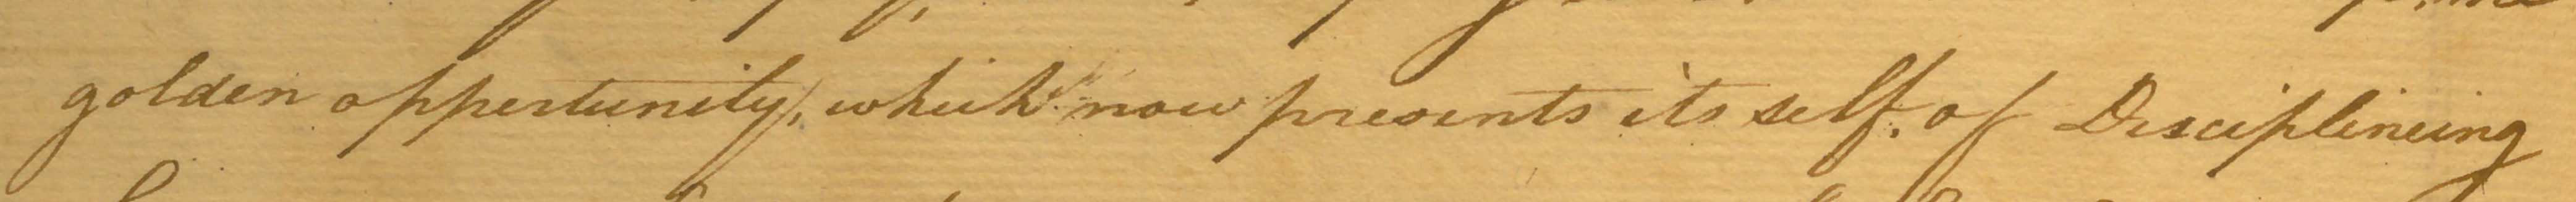golden oppertunity which no presents itself of Disciplining
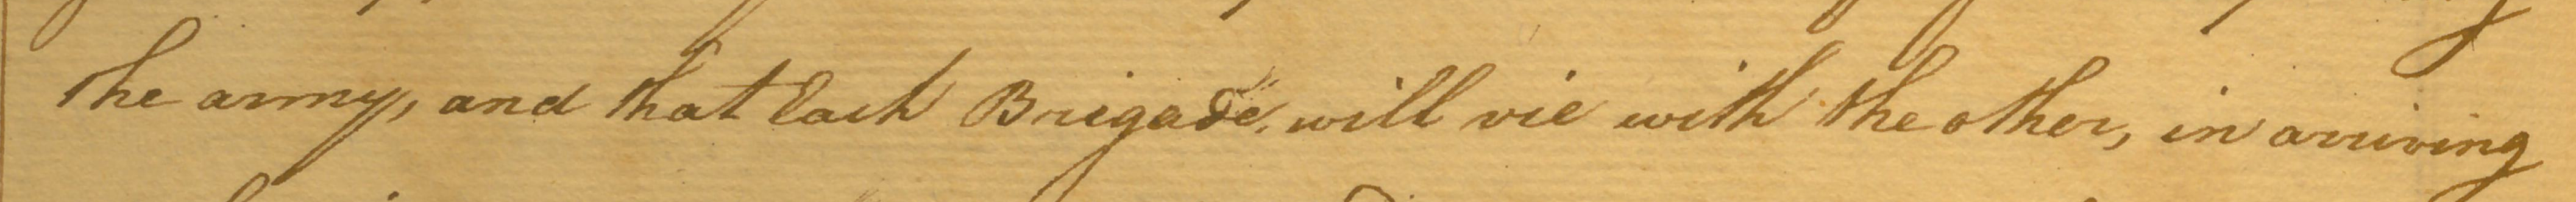the army, and that Each Brigade will vie with the other, in arriving
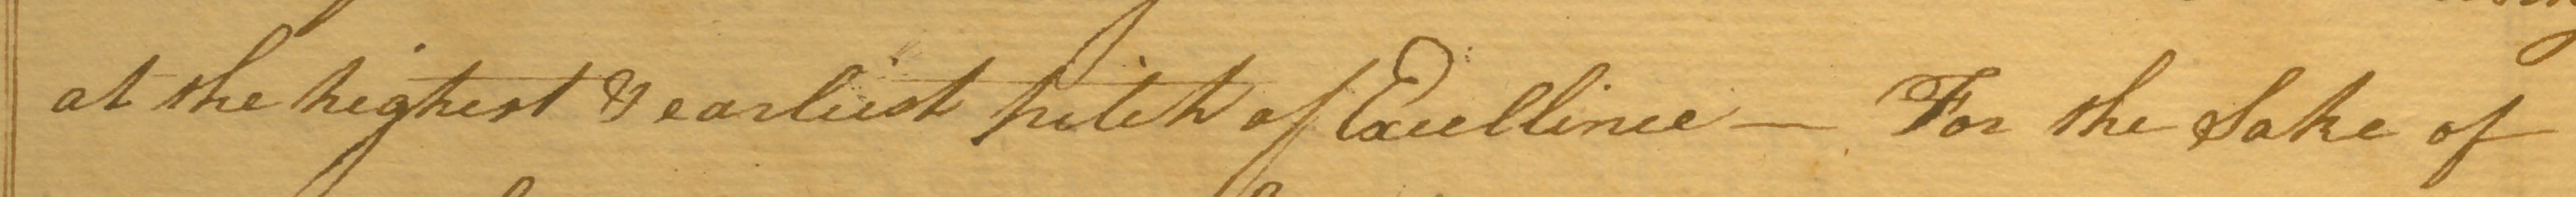at the highest & earliest pitch of Excellence- For the Sake of
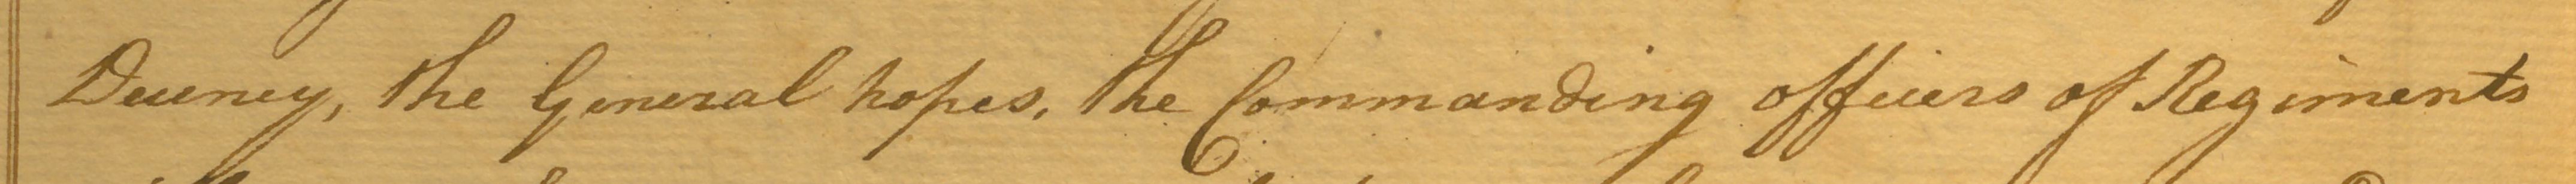Decency, the General hopes the Commanding officers of Regiments
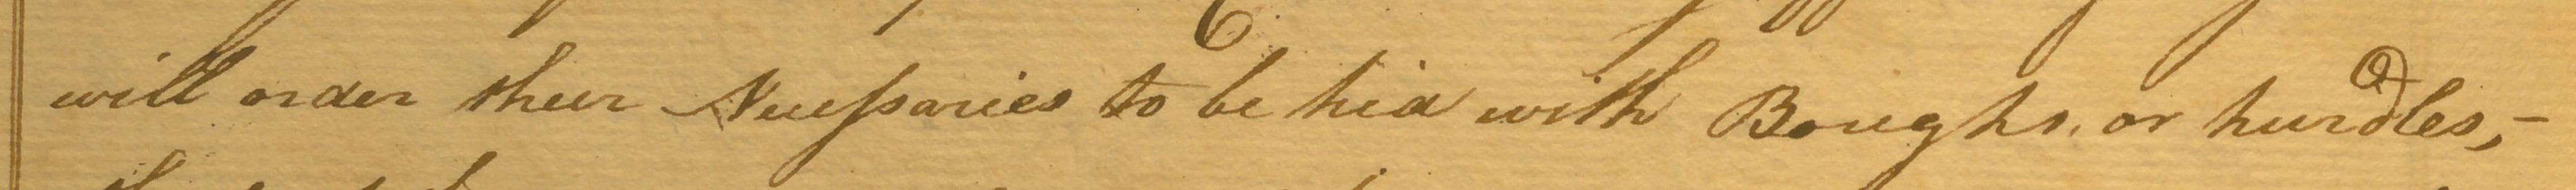will order their Necessaries to be hid with Boughs or hurdles,-
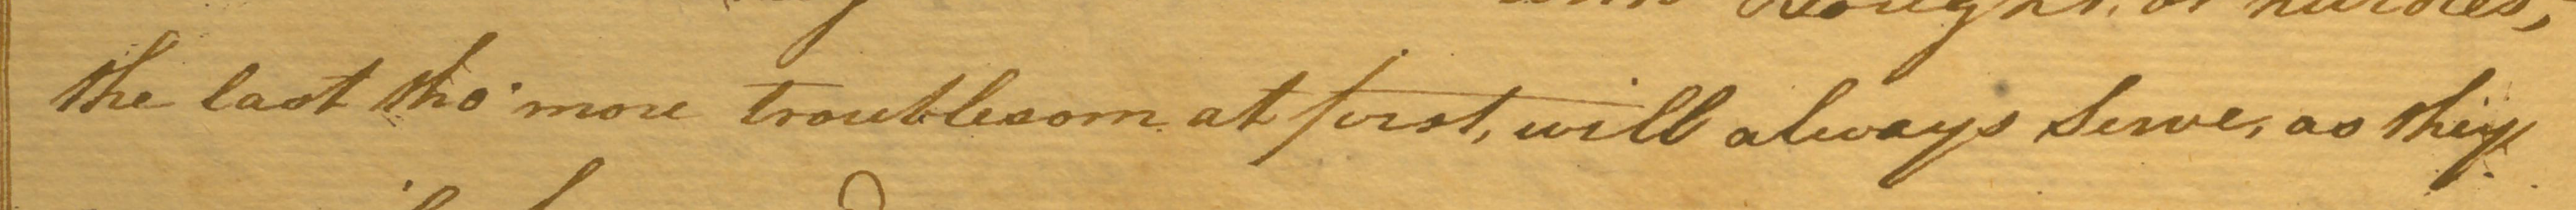the last tho' more troublesom at first, will always serve as they
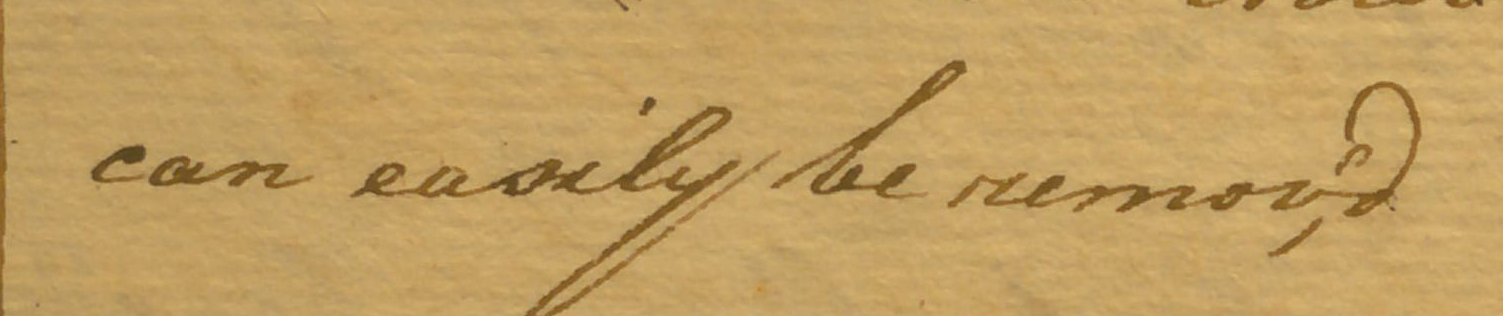can easily be remov'd.
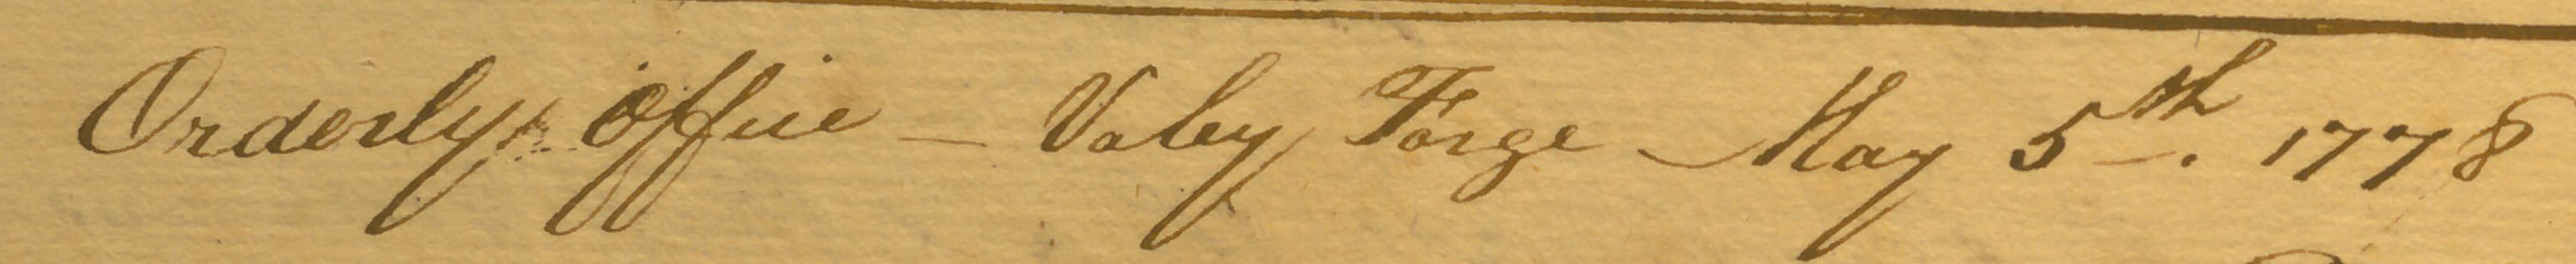Orderly Office- Valley Forge May 5^th. 1778
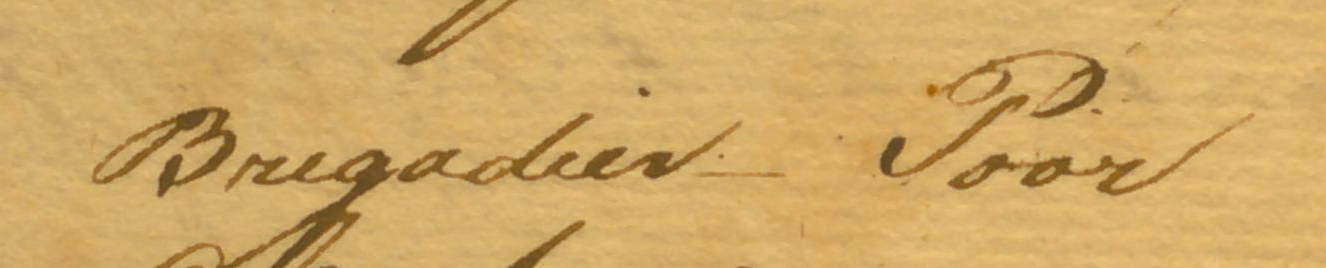Brigadier- Poor
